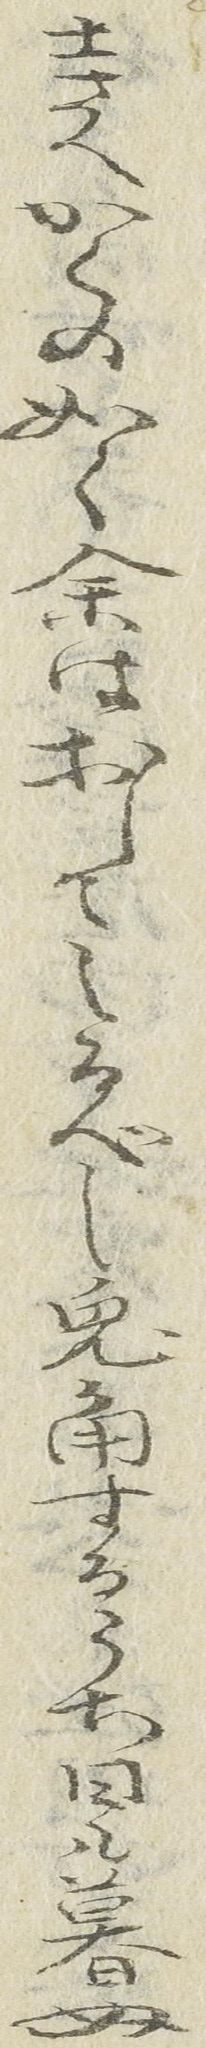士さへかくの如く余はおしてしるべし兎角するうち日も暮ぬ
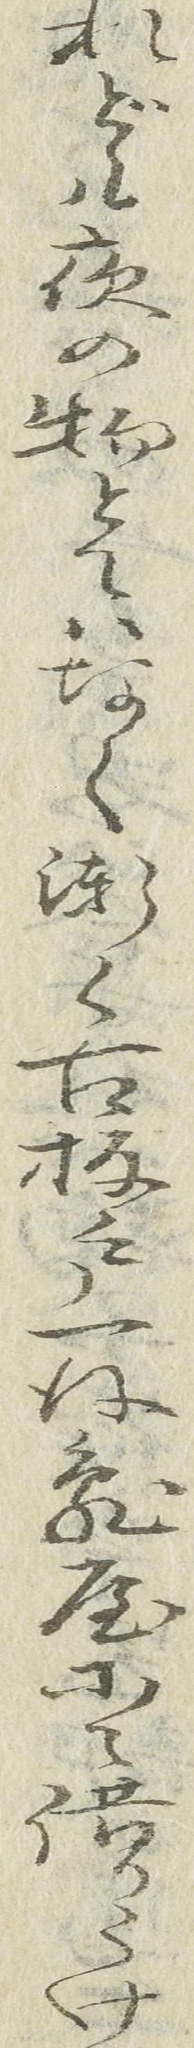れども夜の物とてハなく漸く古板戸一枚亀屋にて借りうけ
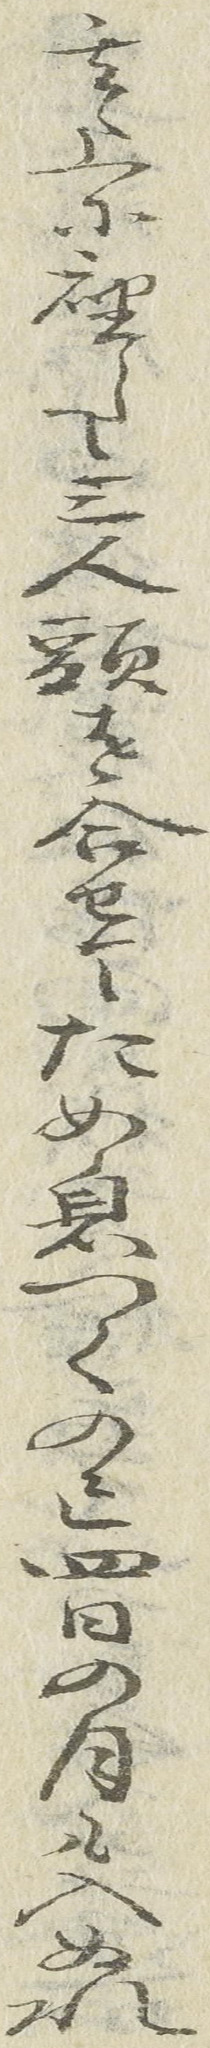其上に座して三人頭を合せてため息つくのみ四日の月も入ぬれ
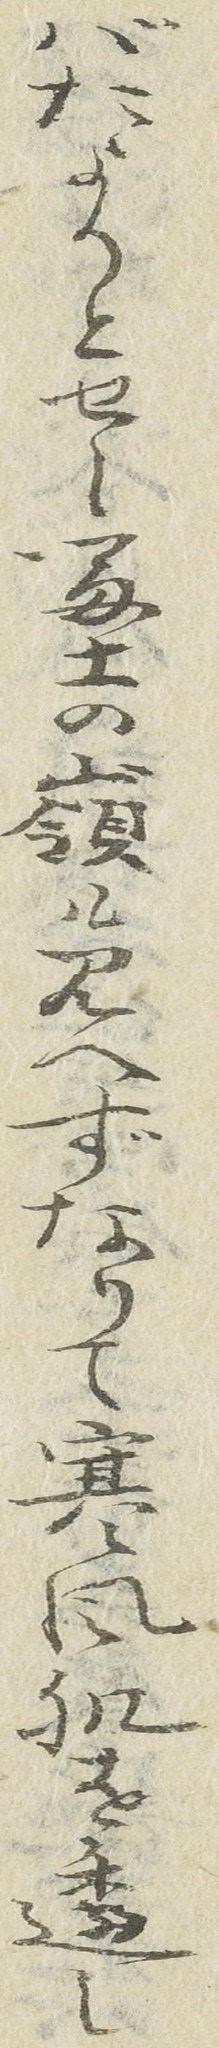バたよりとせし富士の嶺も見へずなりて寒風肌を透し
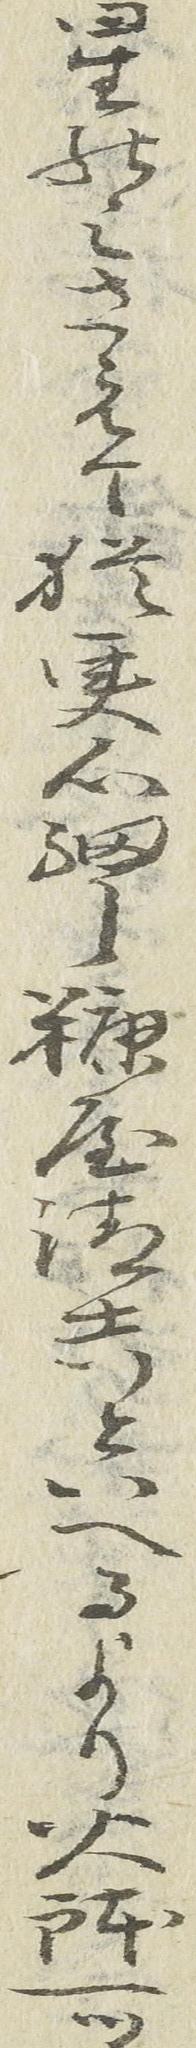星のみさえて猶更心細し糠屋清吉といへるより火鉢一ツ
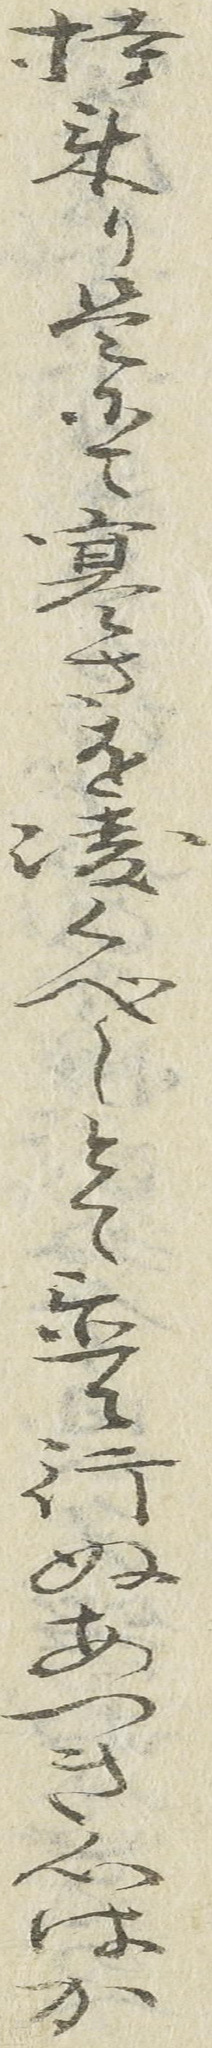持来り是にて寒さを凌くべしとて置て行ぬあつき心はか

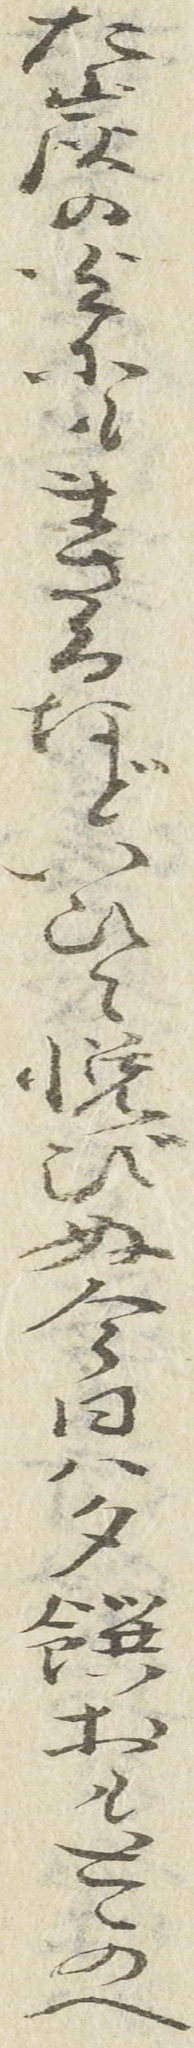た炭の火にもまさるなどいひて悦びぬ今日は夕饌おもとゝのへ
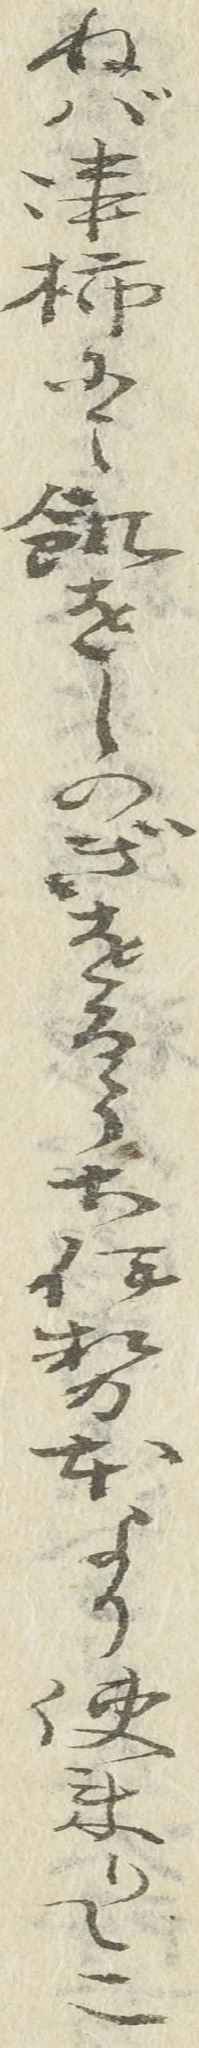ねば串柿にて飢をしのぎをるうち伊勢本より使来りてこ
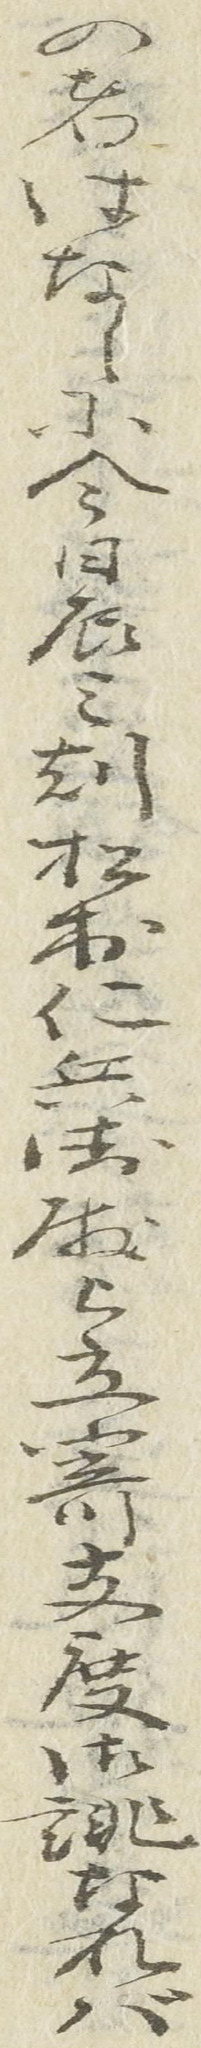の者はなしに今日辰之刻松村仁兵衛殿被立寄支度御誂なれバ
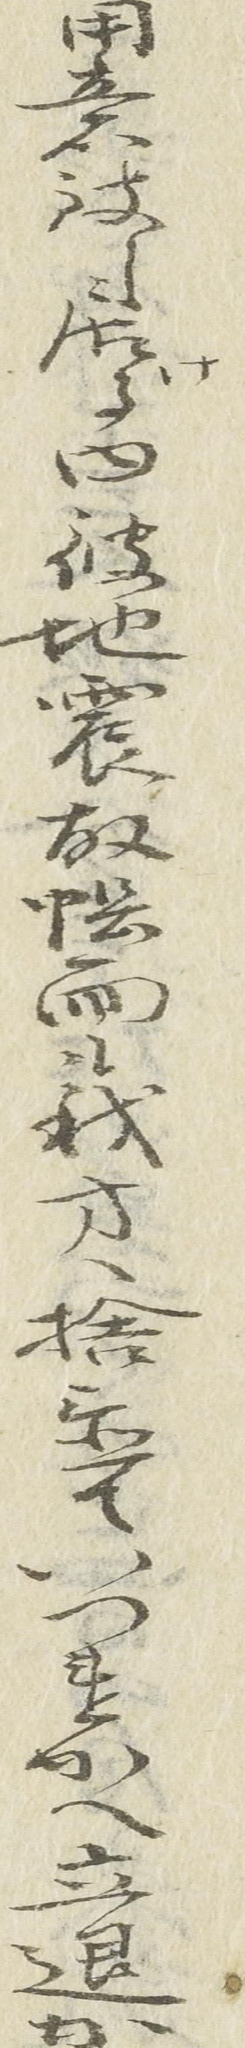用意致し居ける内彼地震故帳面も我方へ捨置ていつれかへ立退か
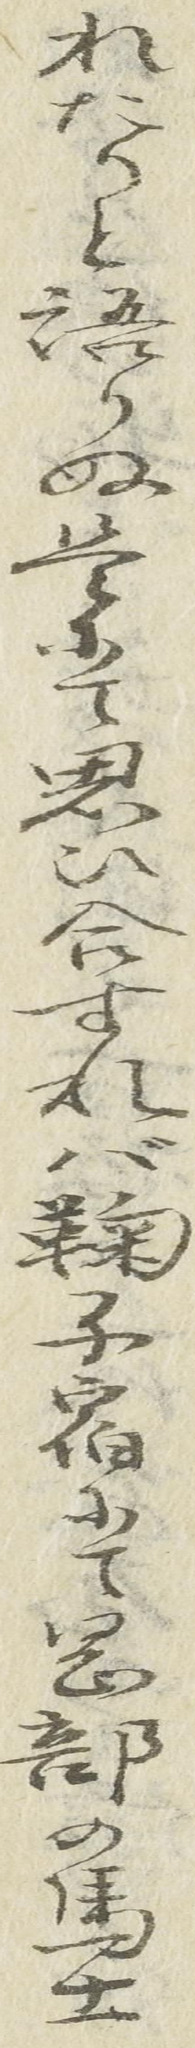れたりと語りぬ是にて思ひ合すれば鞠子宿にて岡部の馬士
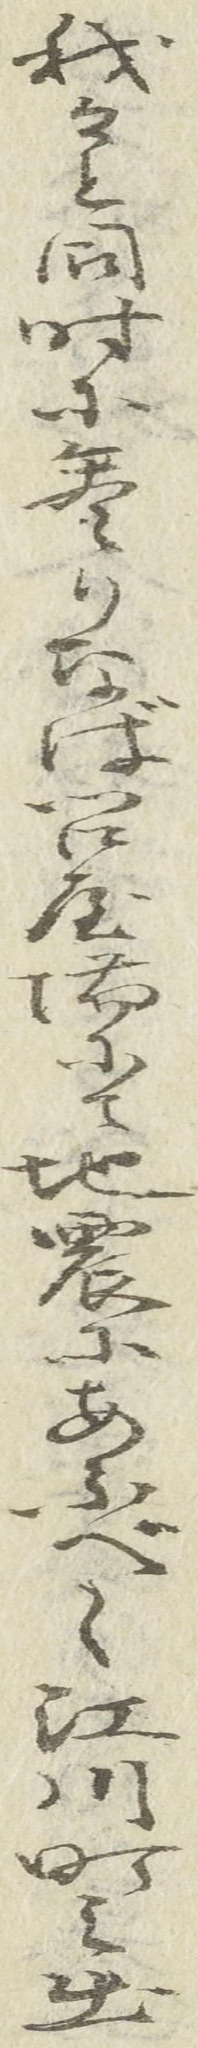我々と同時に参りなば問屋場にて地震にあふべし江川町之出
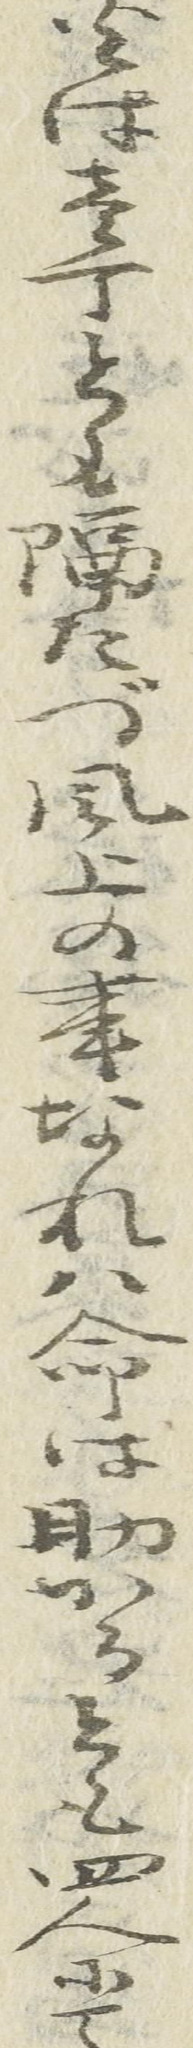火は壱丁とも隔たづ風上の事なれは命は助かるとも四人にて
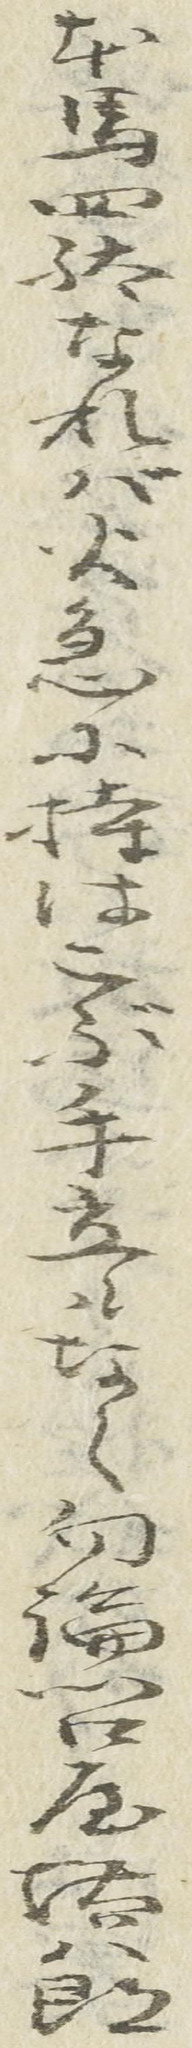本馬四駄なれば火急に持はこぶ手立もなく勿論問屋場は即
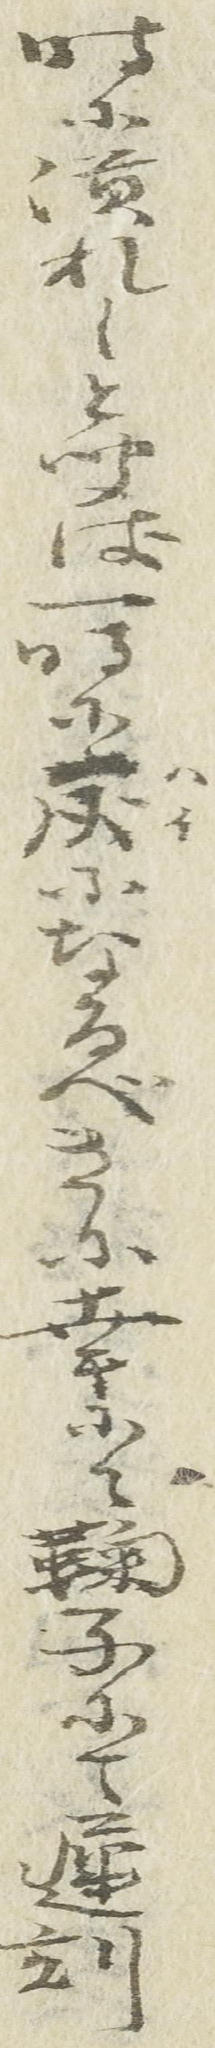時に潰れしと聞ば一時に灰になるべきに幸にて鞠子にて遅刻
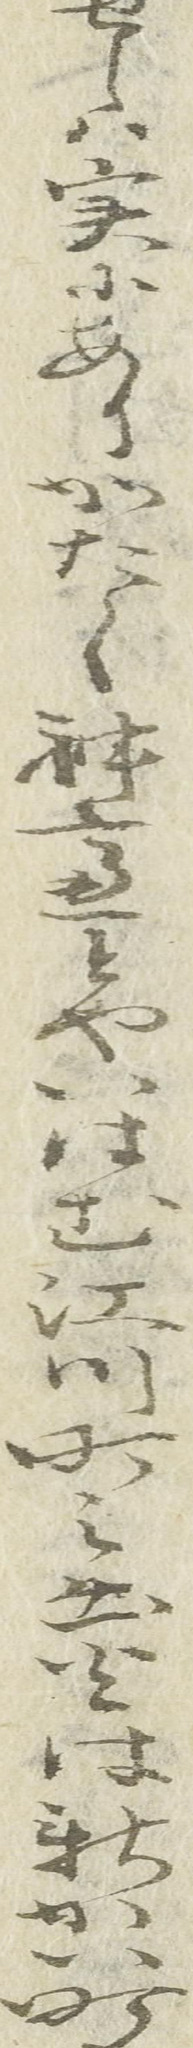せしは実にありがたく神慮とやいはむ江川町の出火は新かい町
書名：地震前兆集　全
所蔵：東京大学地震研究所図書室 Earthquake Research Institute Library, The University of Tokyo, JAPAN
